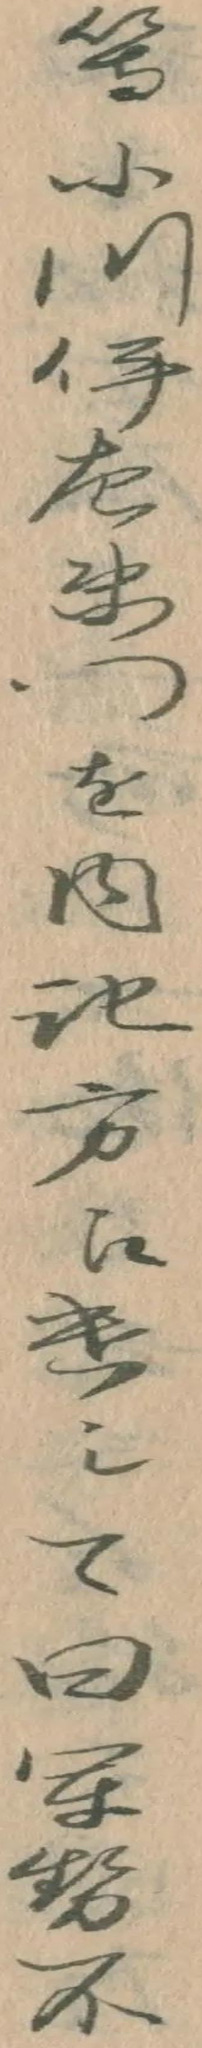等小川伊左衛門を内記方江遣して曰軍勢不
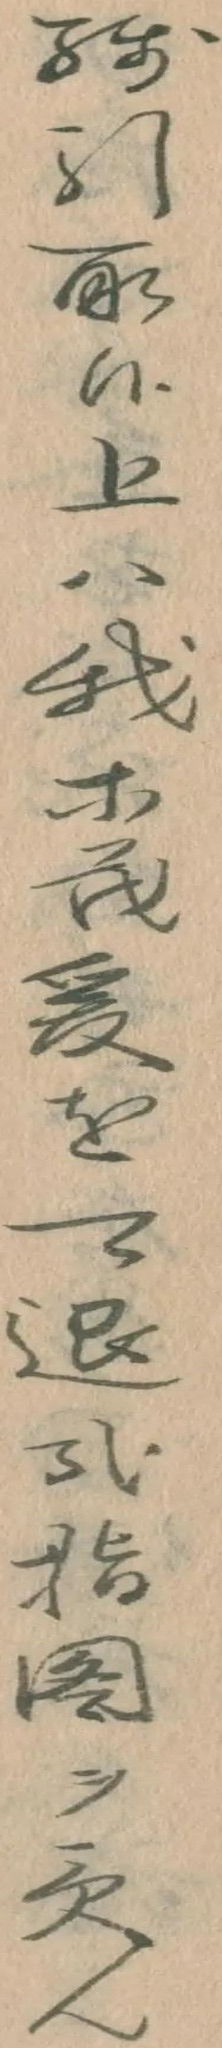残引取候上は我等茂爰を可退哉指図を受ん
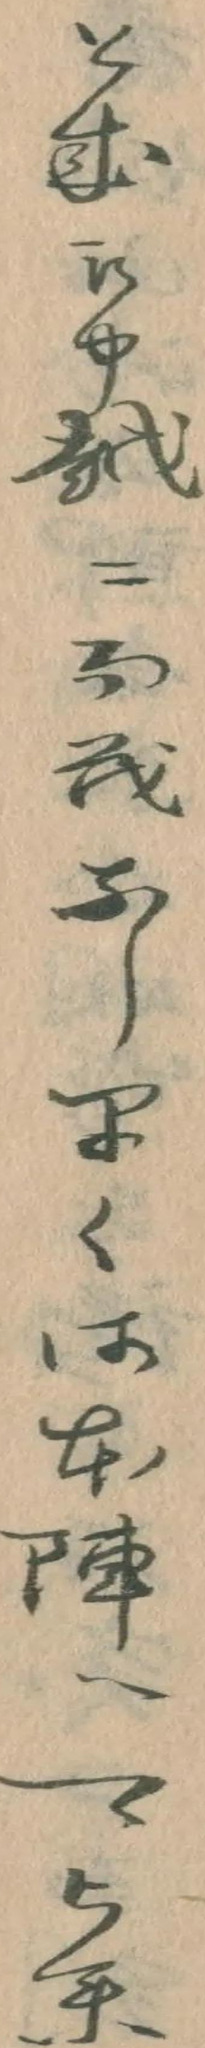と成被申越に而茂なし早く御本陣へ可被参
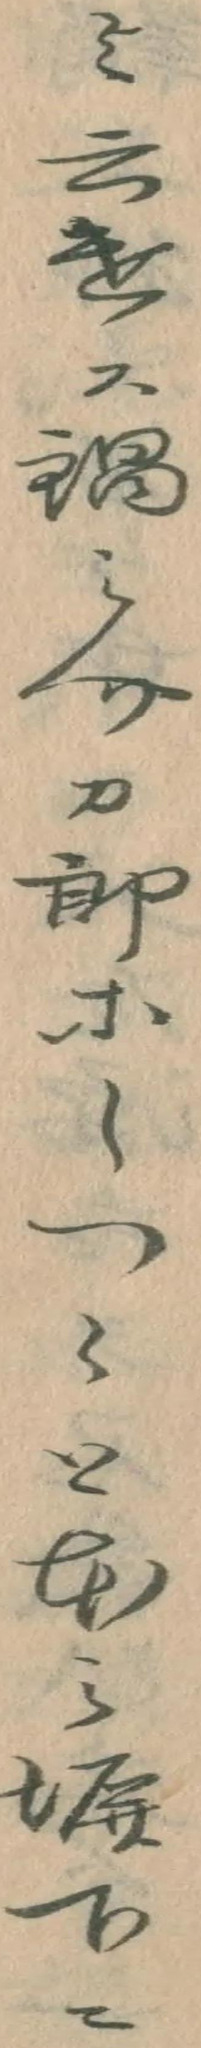与云遣す鍋之介か郎等しつゝと本之塀下に
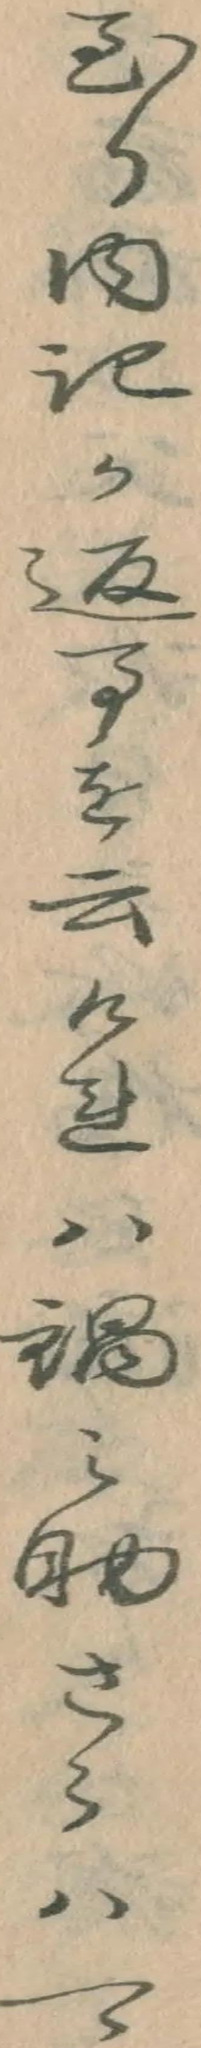至り内記か返事を云け連は鍋之介さらは可

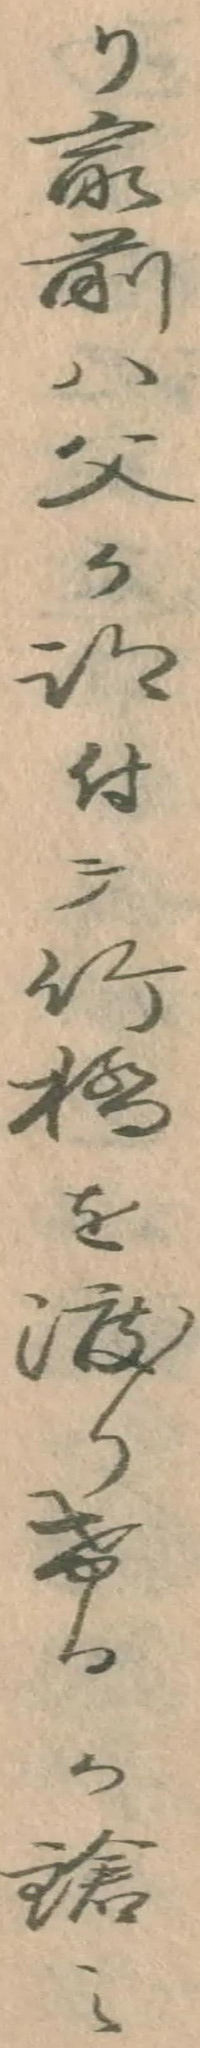り㝡前は父か跡付て竹橋を渡り希るか鎗之
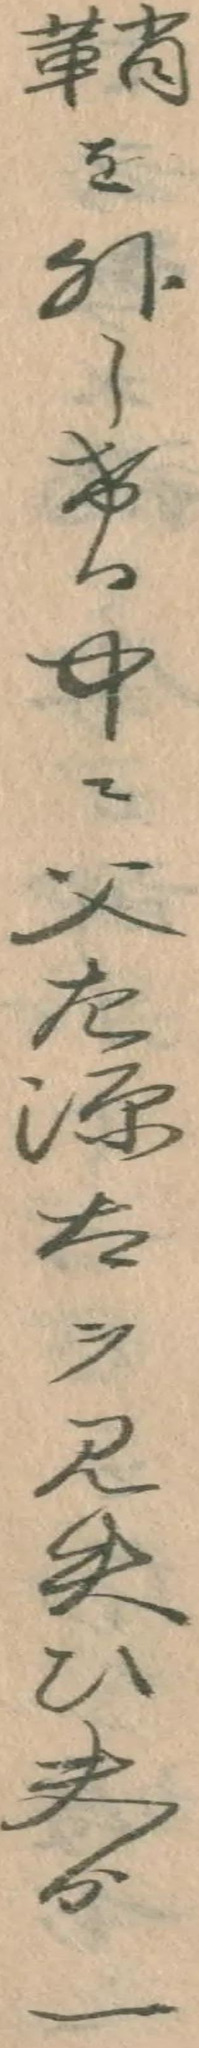鞘を外し希る中に父左源太を見失ひ夫ゟ一
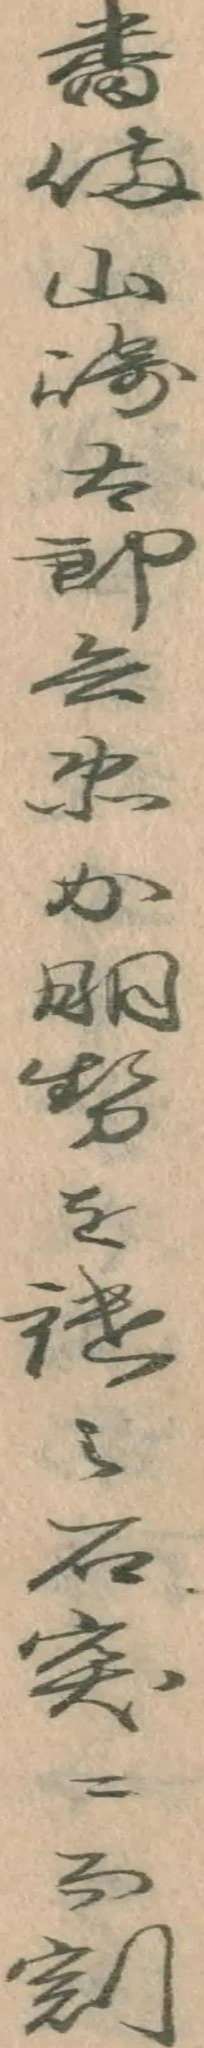番備山崎太郎兵衛か朋勢を鑓之石突に而割
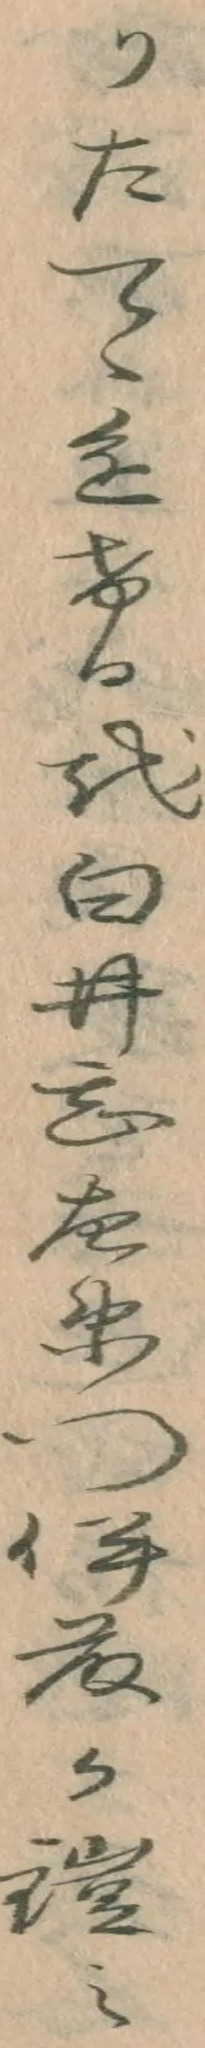りたてゝ進希る越白井甚左衛門伊藤か鎧之
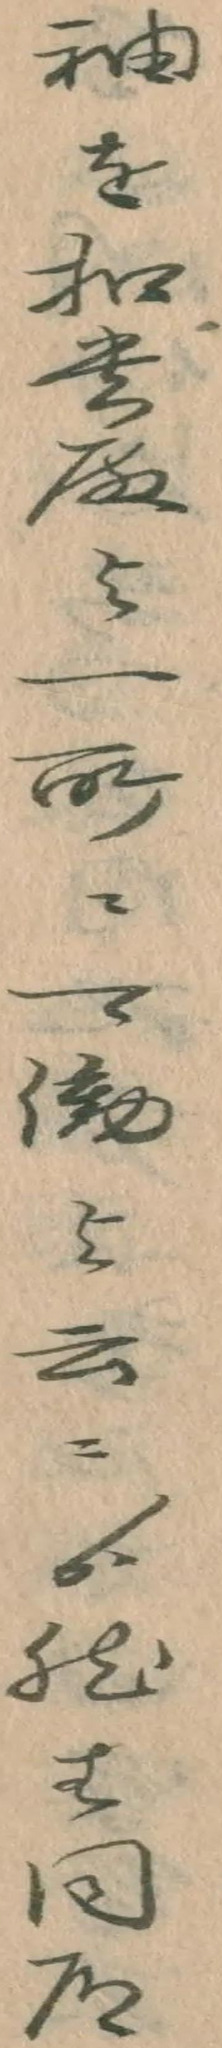袖を扣貴殿与一所に可働与云にゟ然者同道
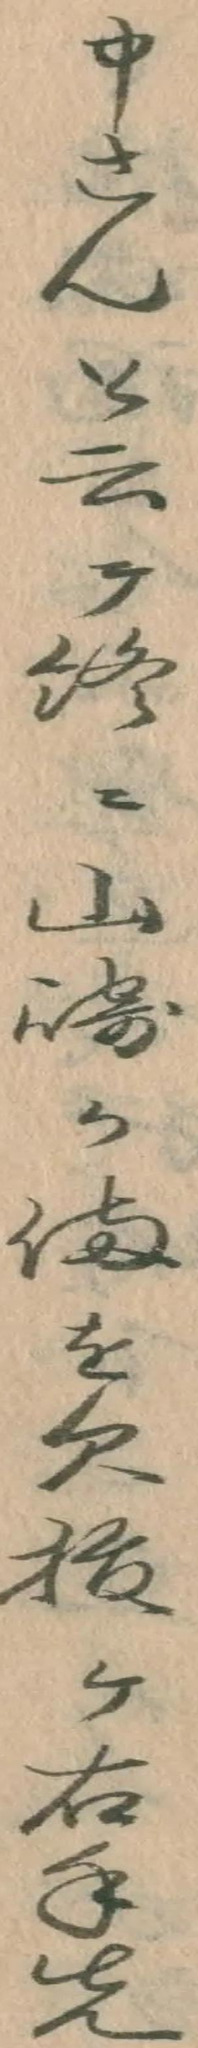申さんと云て終に山崎か備を欠抜け右手先
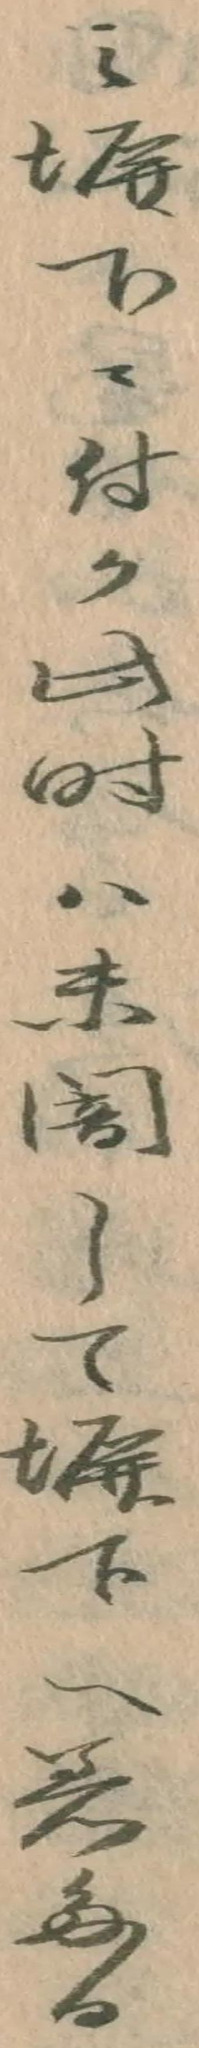之塀下に付く此時は未闇して塀下へ差多る
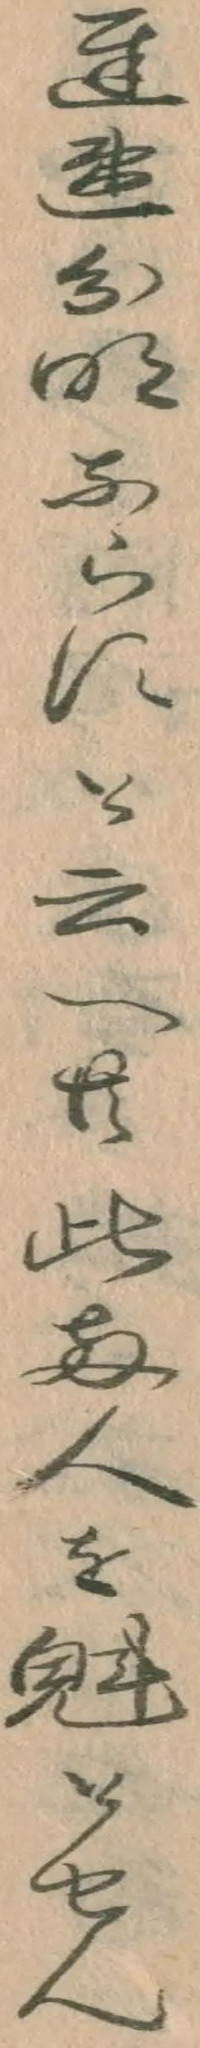遅速分明なら須と云へ共此両人を魁とせん
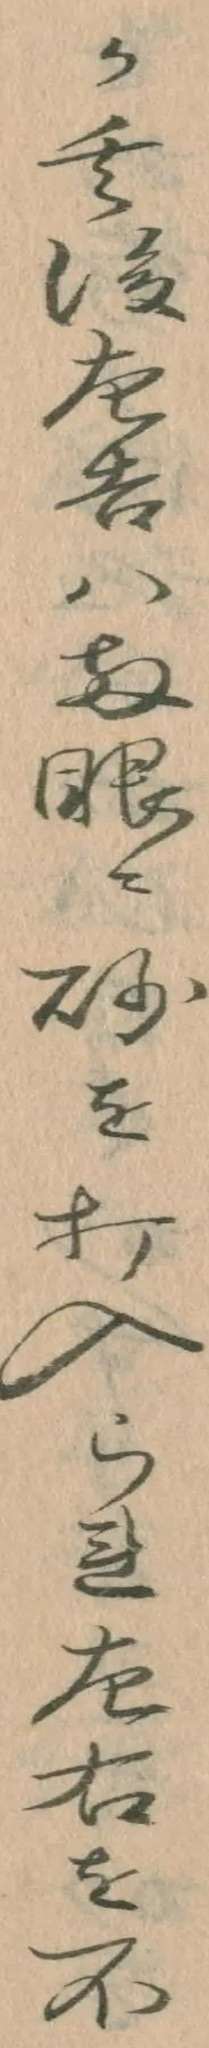か其後左吉は両眼に砂を打入ら連左右を不
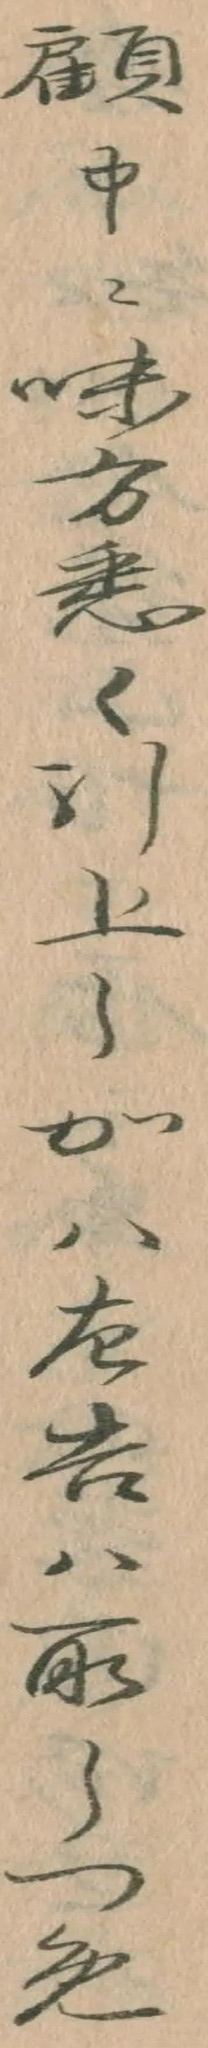顧申に味方悉く引上しかは左吉は取しつ免
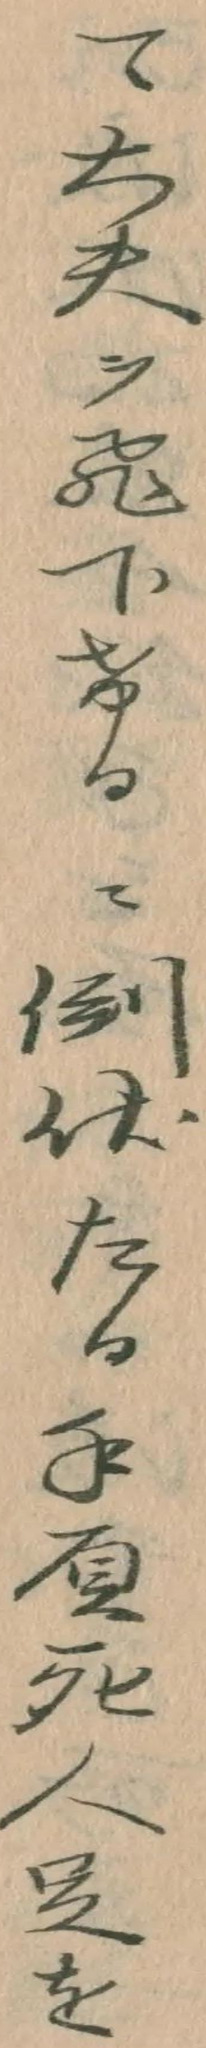て大夫を飛下希るに倒伏たる手負死人足を
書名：切支丹御退治記 49巻. [5]
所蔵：国立国会図書館 National Diet Library, JAPAN
